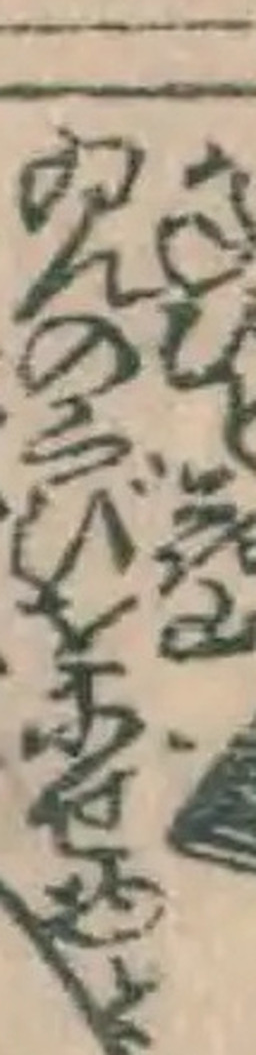ゐんのくびをにせ物と
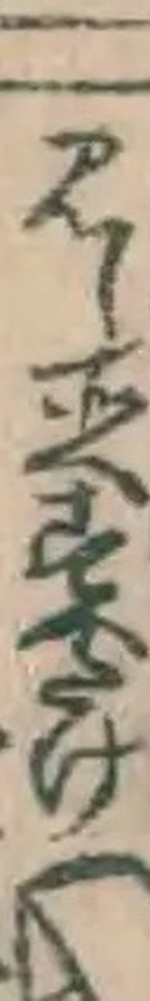見し所へすへたけ
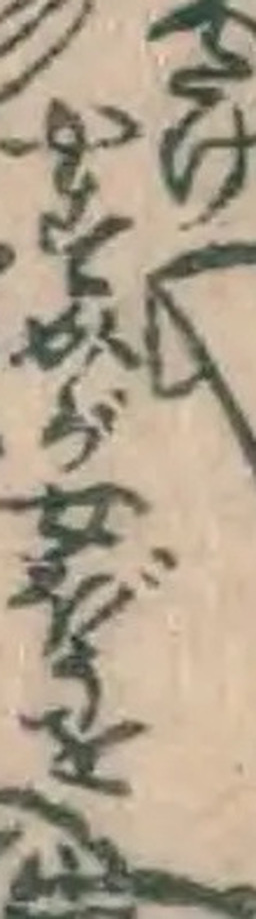やす介が女ぼうを
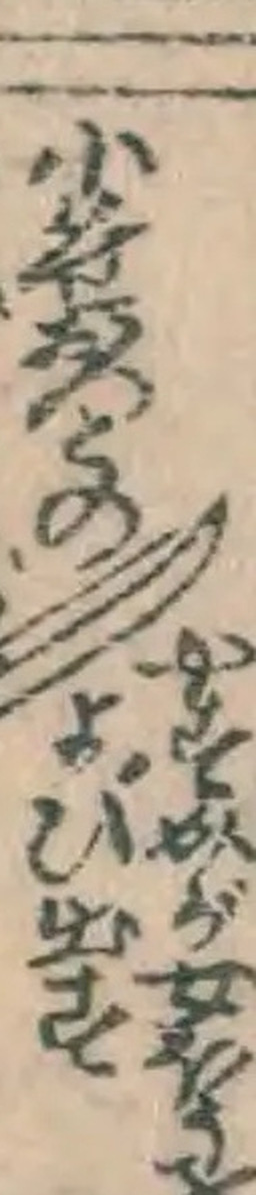小笹おつとの
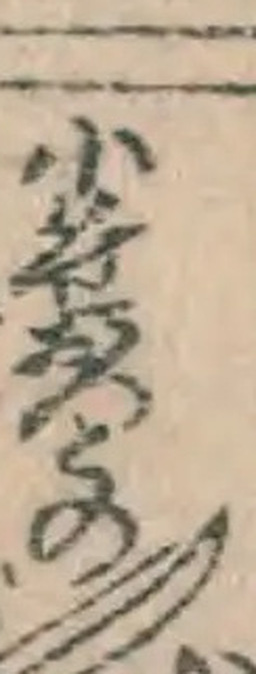小笹おつとの
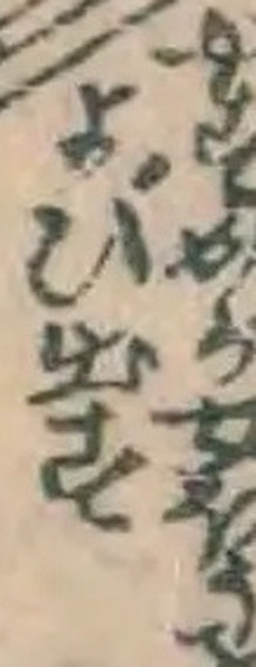よび出す
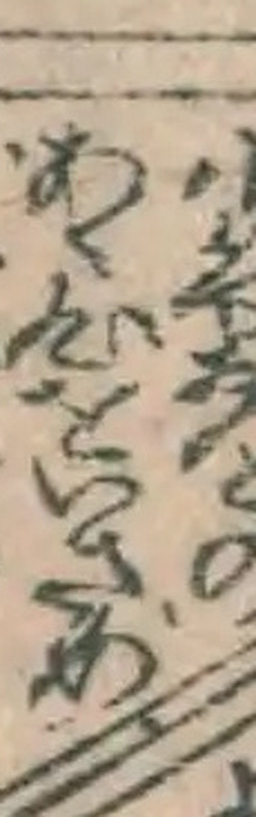あく心をいさめ
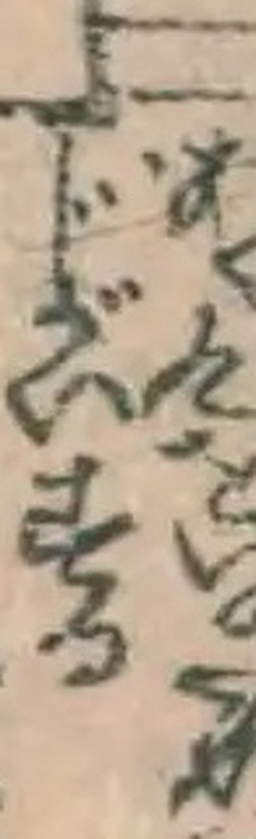じがいする
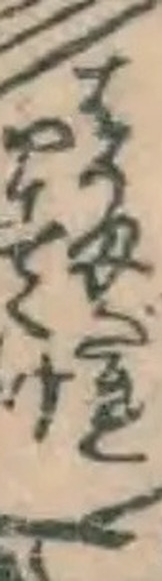はかまだれ
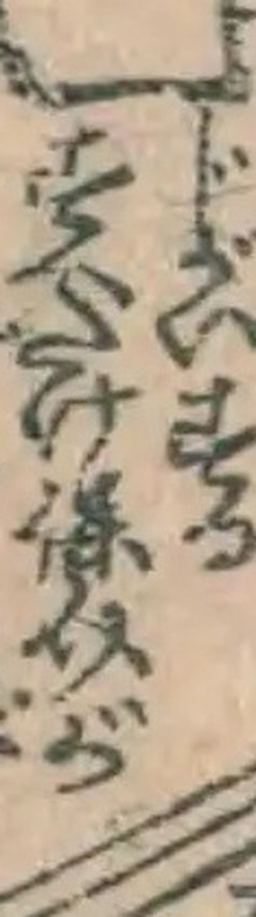すへたけ保介が
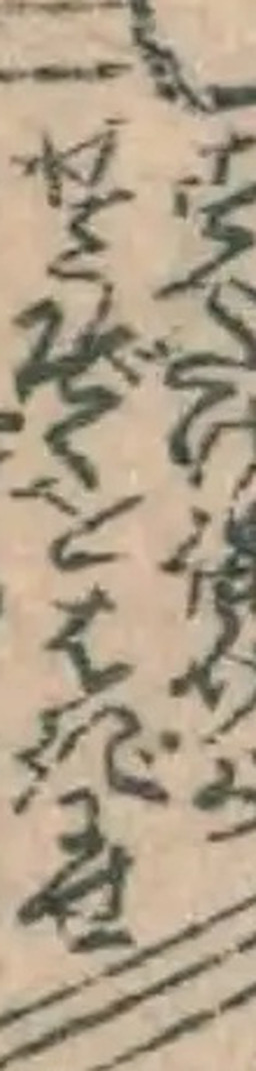せうぞくをはぎにせ
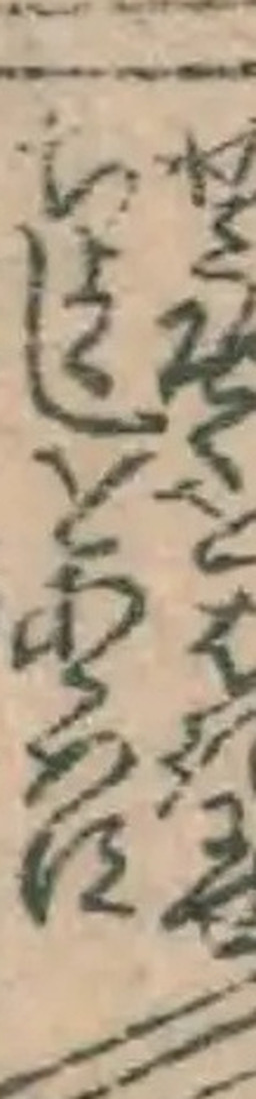ちよくしをあらはす
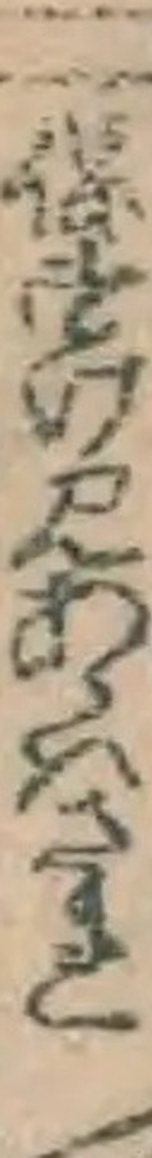保すけ見あらはされ
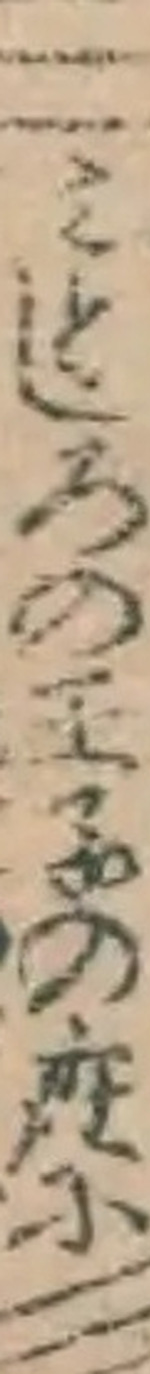みとしろの王子のに
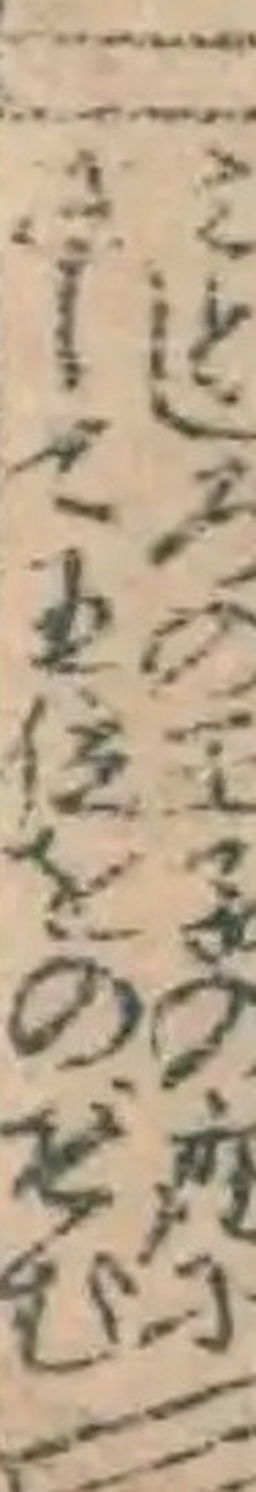さして王位をのぞむ
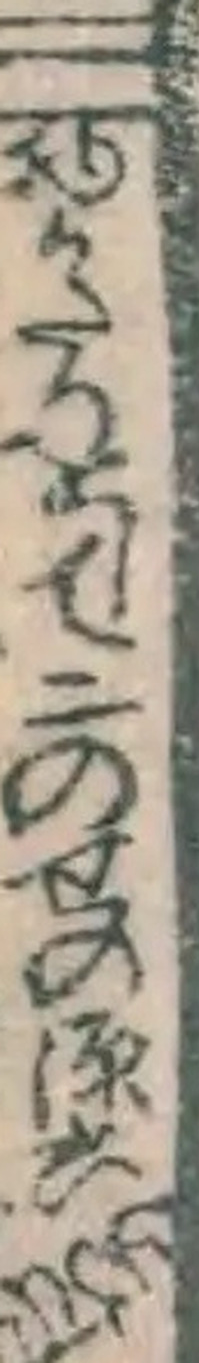物かたりをして二のせ源六
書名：四天王宿直着綿
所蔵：国立国会図書館 National Diet Library, JAPAN
